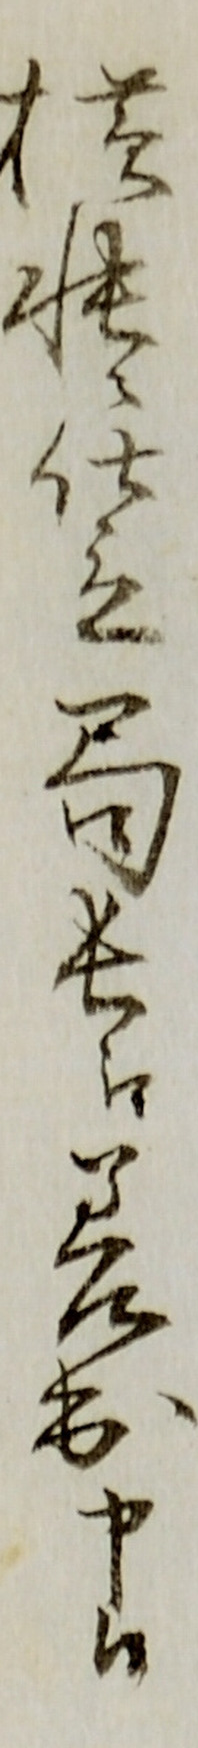横帳に仕立局長え差出申候
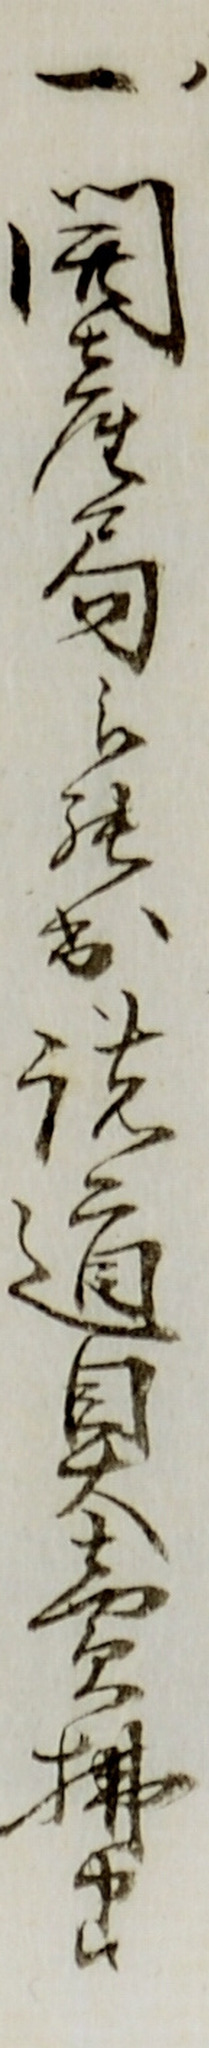一開産局え罷出諸道具売払申候
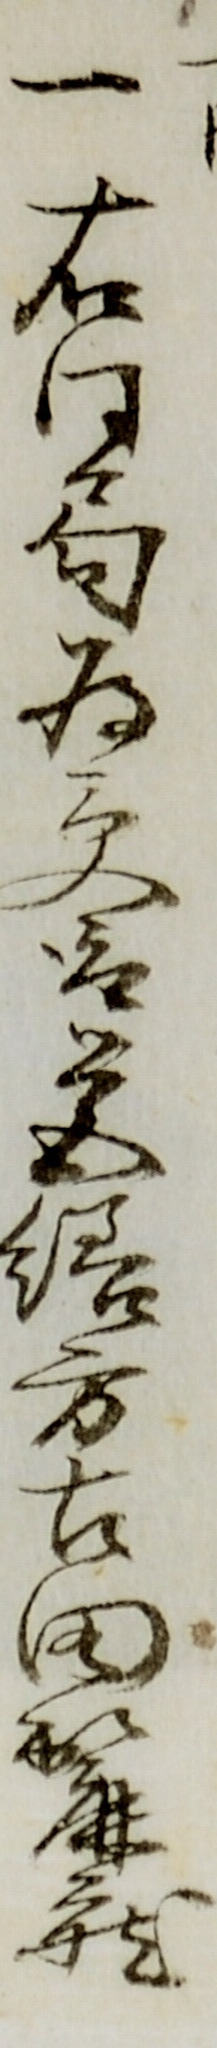一右同局為受取営繕方古田簏蔵
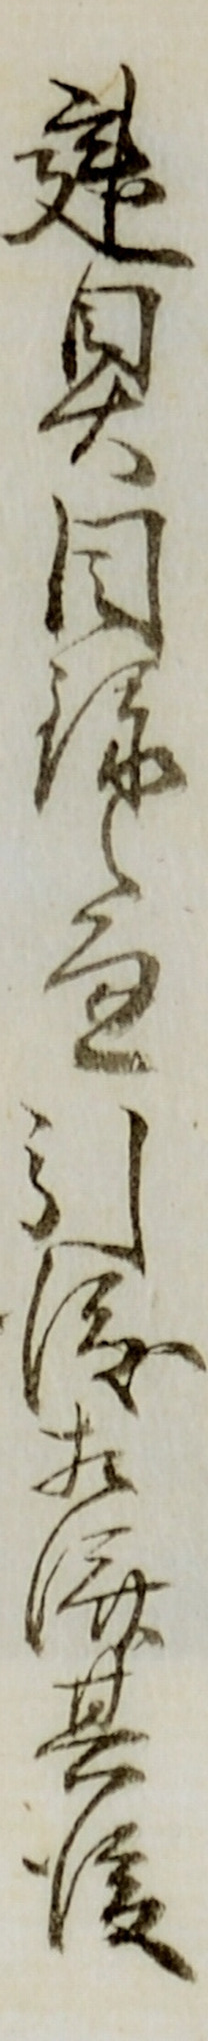建具目録之通引渡相済其後
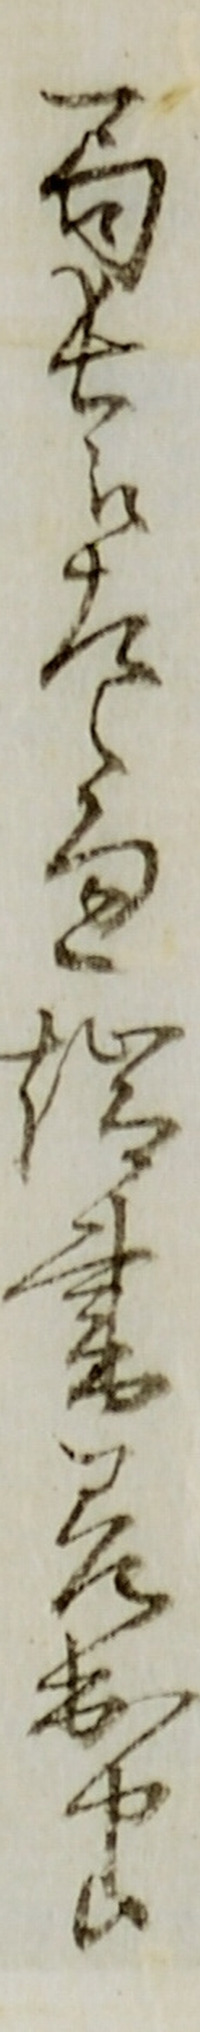局長え左之通端書差出申候
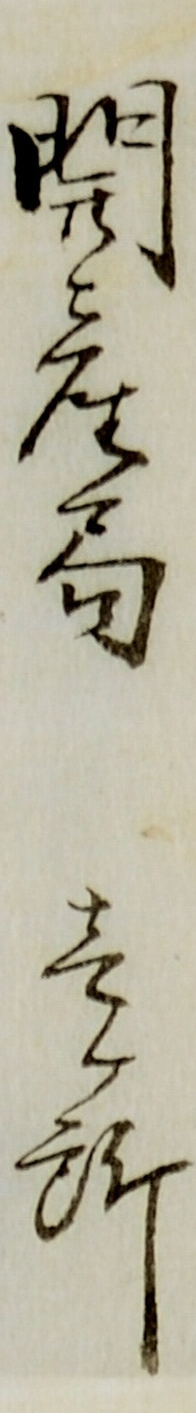開産局壱ヶ所
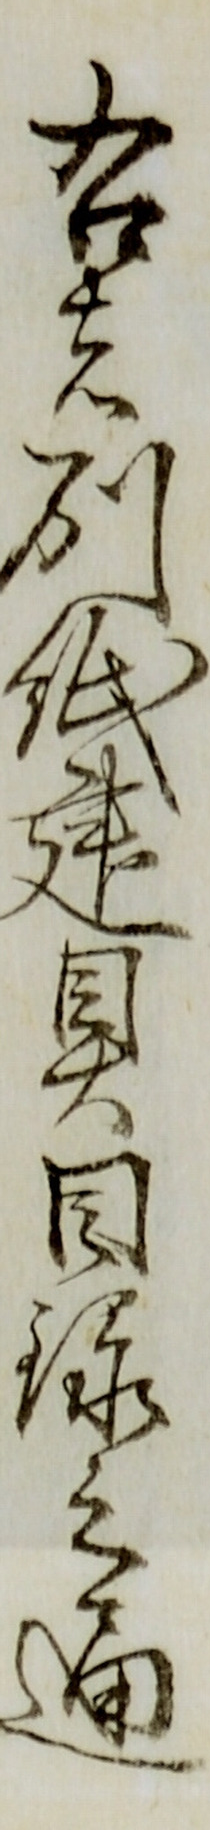右は別紙建具目録之通
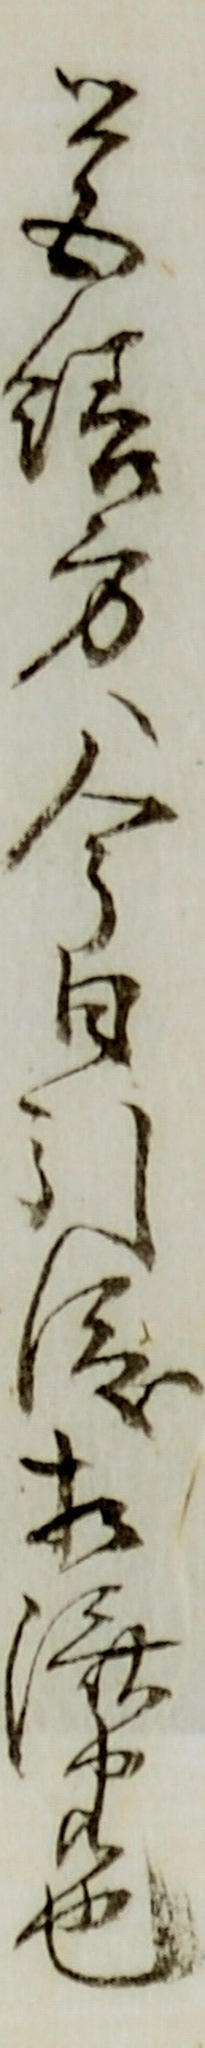営繕方へ今日引渡相済申候也
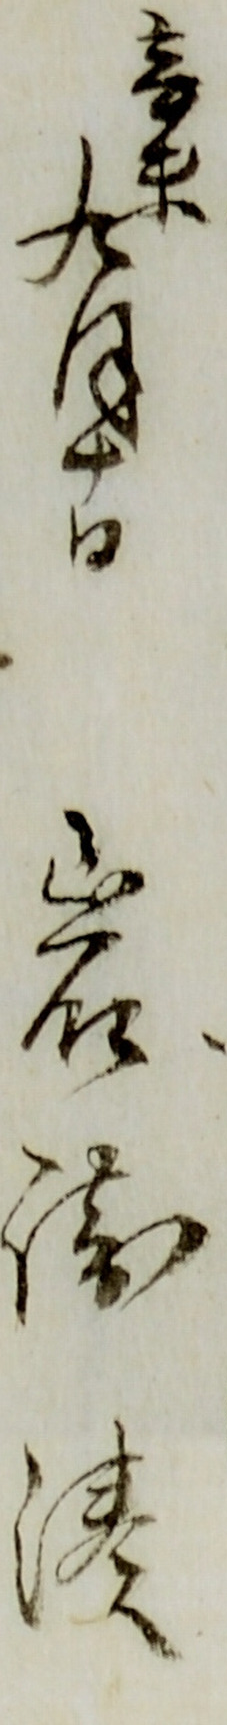辛未九月十日岩崎湊
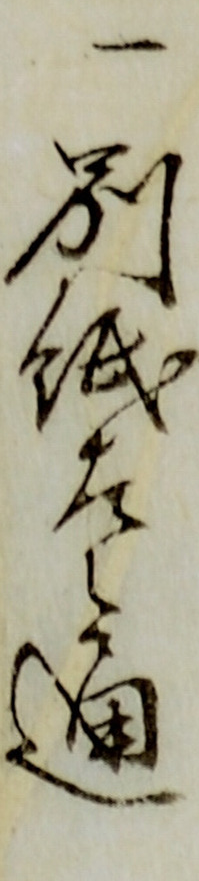一別紙左之通

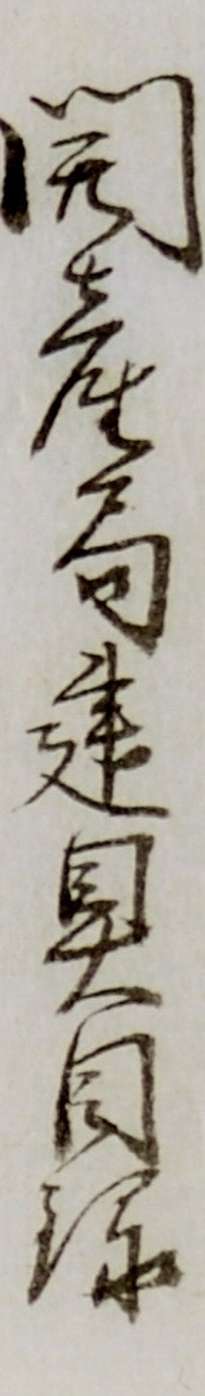開産局建具目録
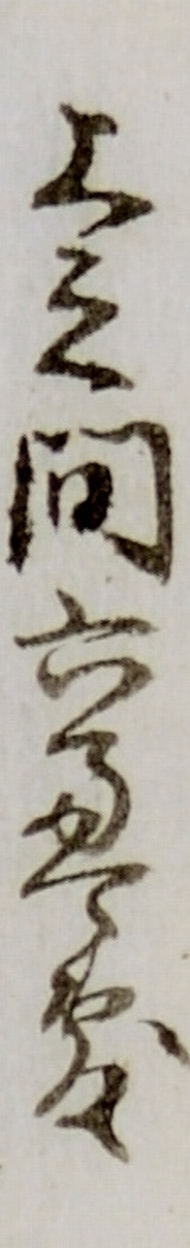上之間六畳敷
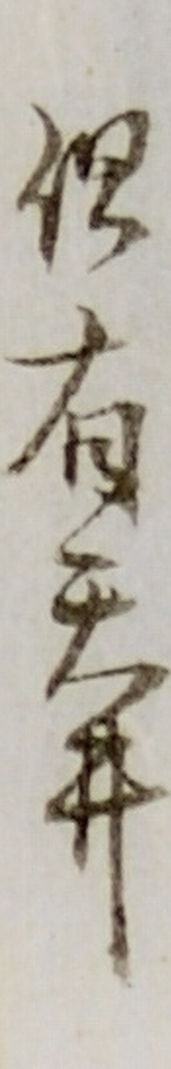但有天井
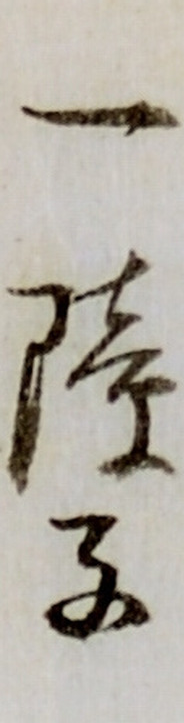一障子
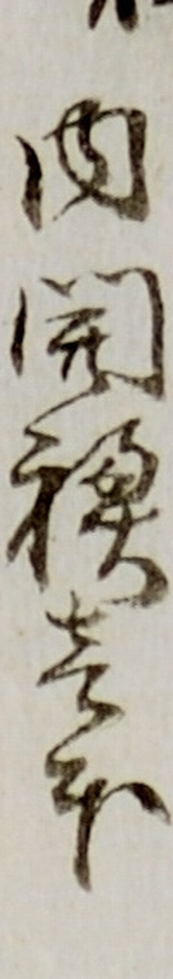内開襖壱本
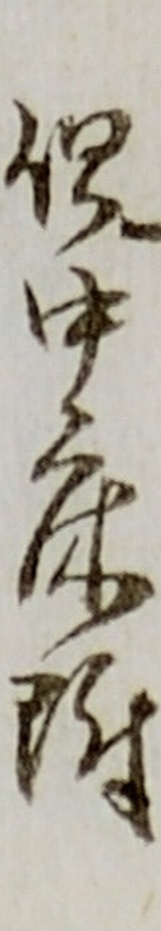但中床附
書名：山林方諸事御用留
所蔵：伊那市立高遠町図書館・合同会社AMANE
